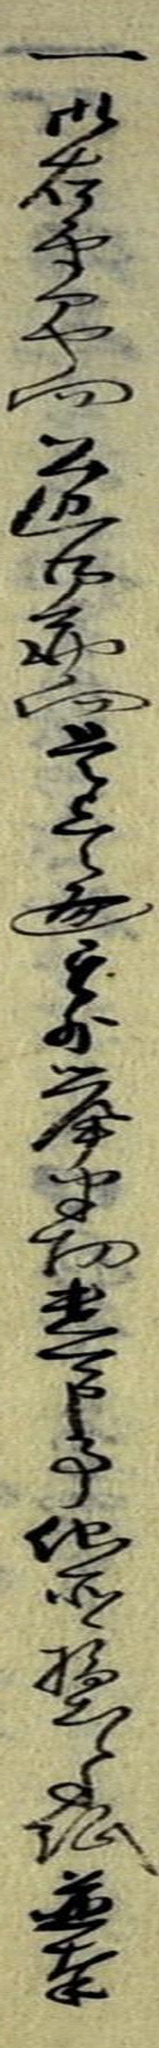一御右筆部屋向公辺御勤向是迄之通其外鼠半切遣可申事他所へ指出候手紙並奉
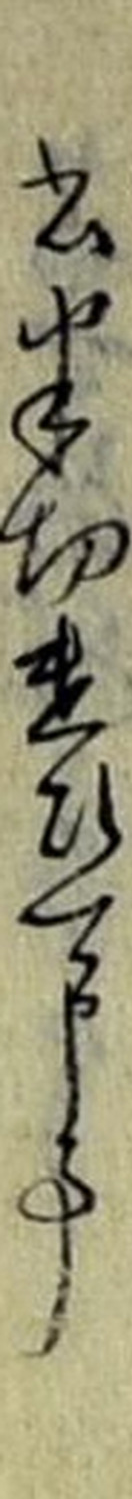書半切遣ひ可申事
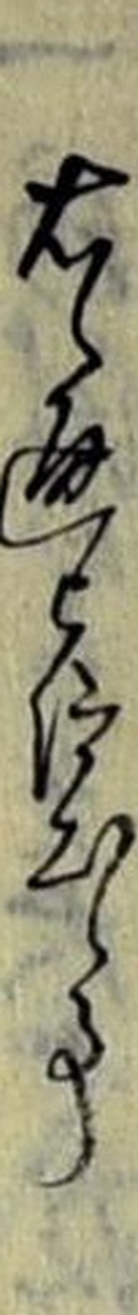右之通被仰出候事
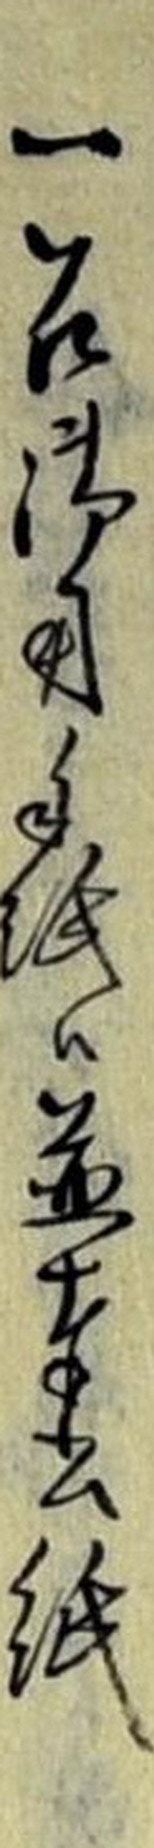一召御用手紙ハ並奉書紙
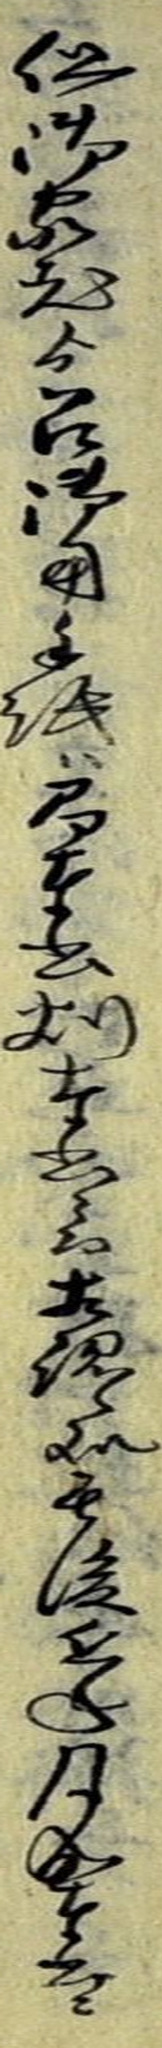但御家老ゟ召御用手紙ハ奉書判奉書ニ而相認候処其後近年月成奉書ニ
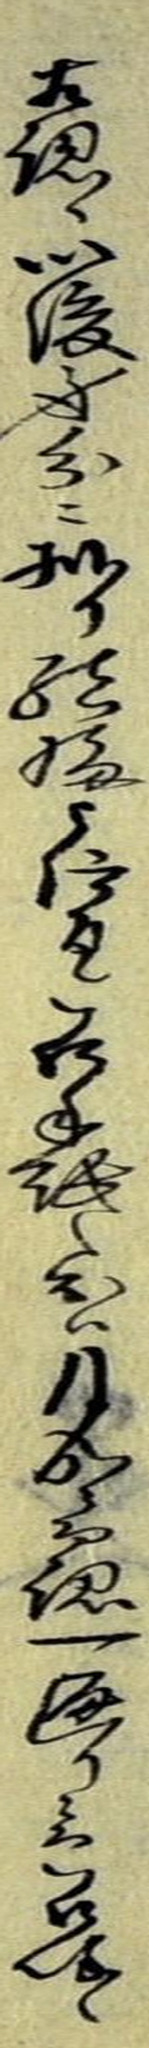相認候以後身分ニ掛り結構被仰付候召手紙之分ハ月成ニ而認一通りニ而召呼候
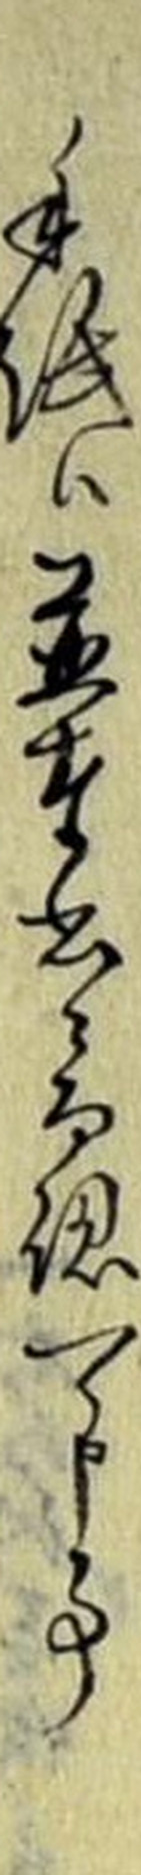手紙ハ並奉書ニ而認可申事
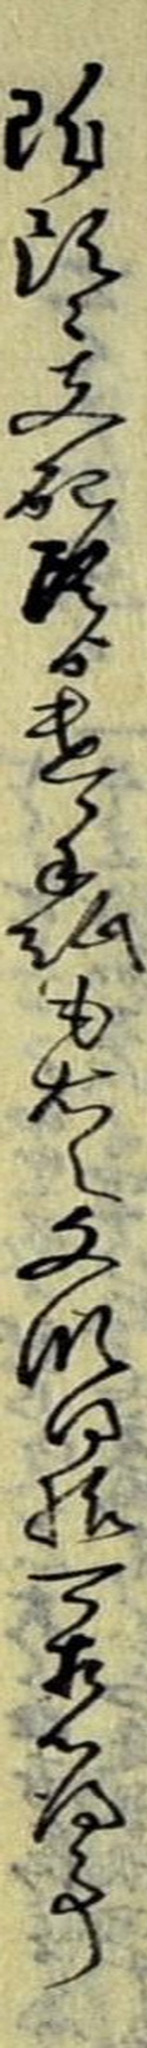附頭々支配頭ゟ遣候手紙も右之文段同様可相心得事

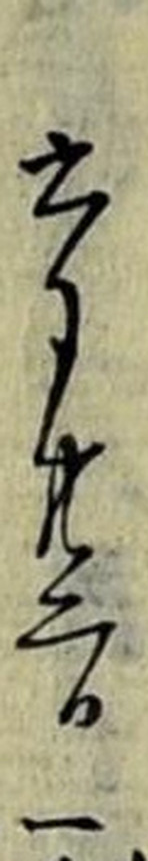七月廿三日
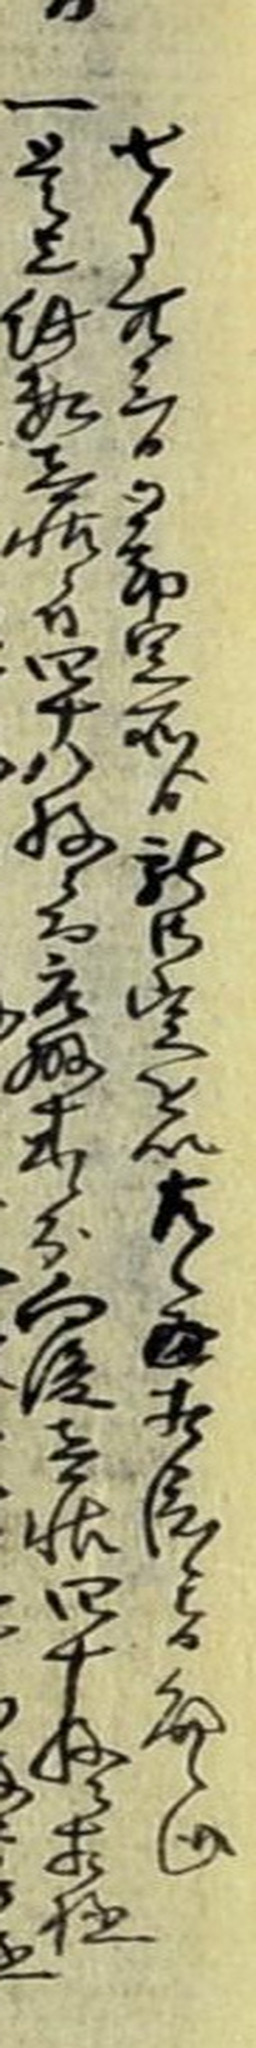一是迄紙数壱帖ニ付四十八枚ニ而取扱来候分向後壱帖四十枚ニ相極
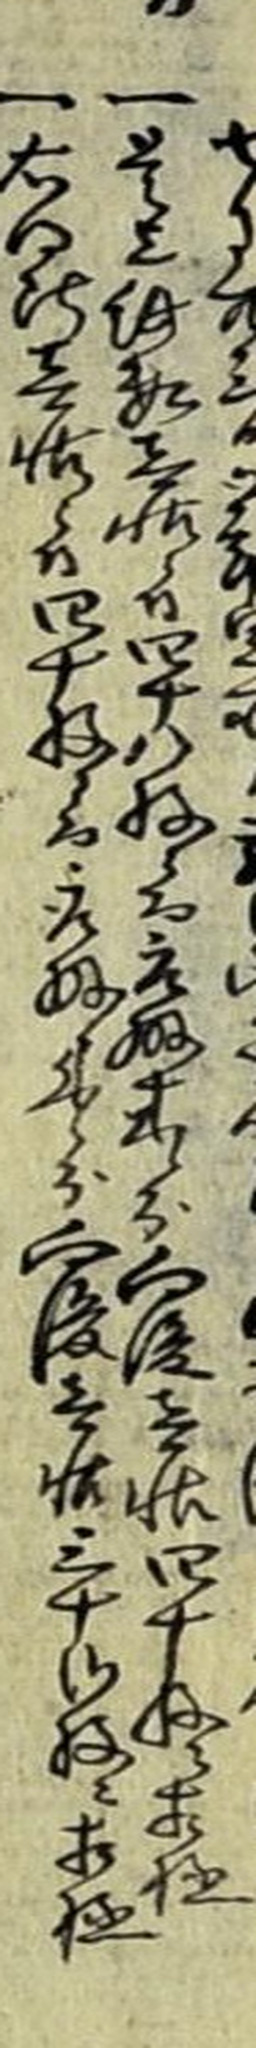一右同断壱帖ニ付四十枚ニ而取扱来候分向後壱帖三十弐枚ニ相極
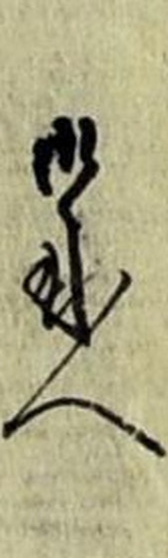御用人
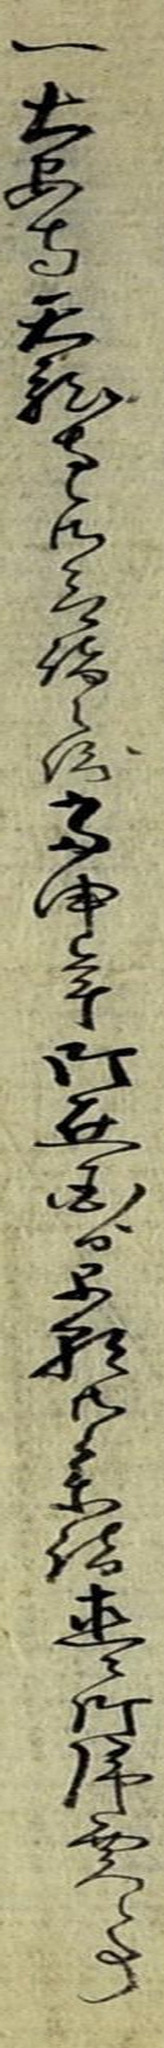一大安寺天龍寺へ御参詣之儀当申年御在国ゟ早朝共参詣直ニ御帰殿之事
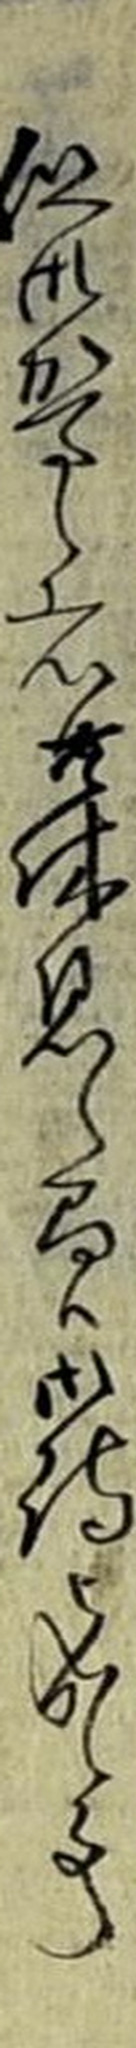但御駕之者共休息之間ハ御待被成候事
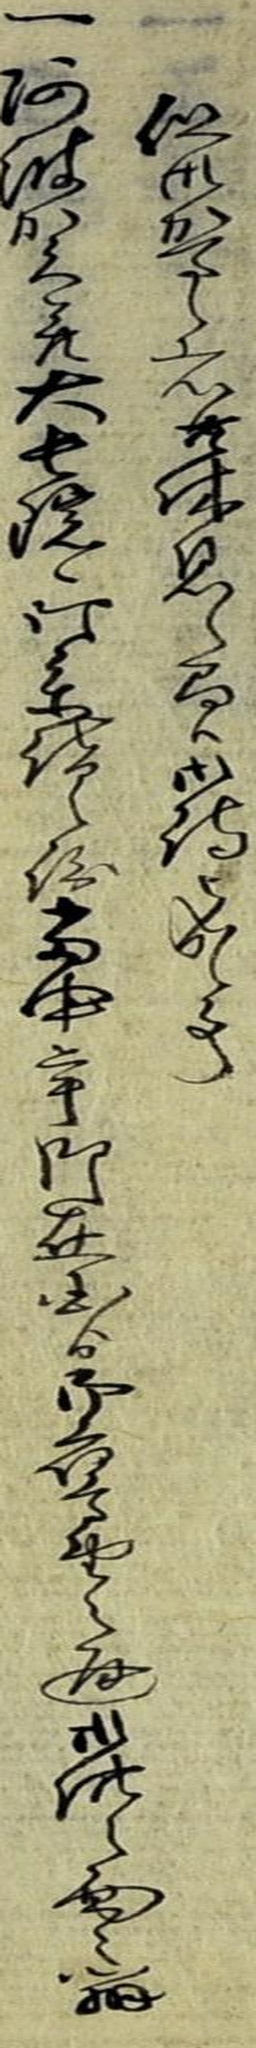一阿波賀并大長院へ御参詣之儀当申年御在国ゟ御鷹野之通御供之面々弁
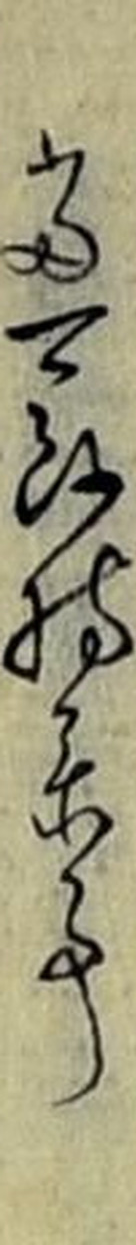当可致持参事
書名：命令之部 三
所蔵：福井県文書館 Fukui Prefectural Archives
